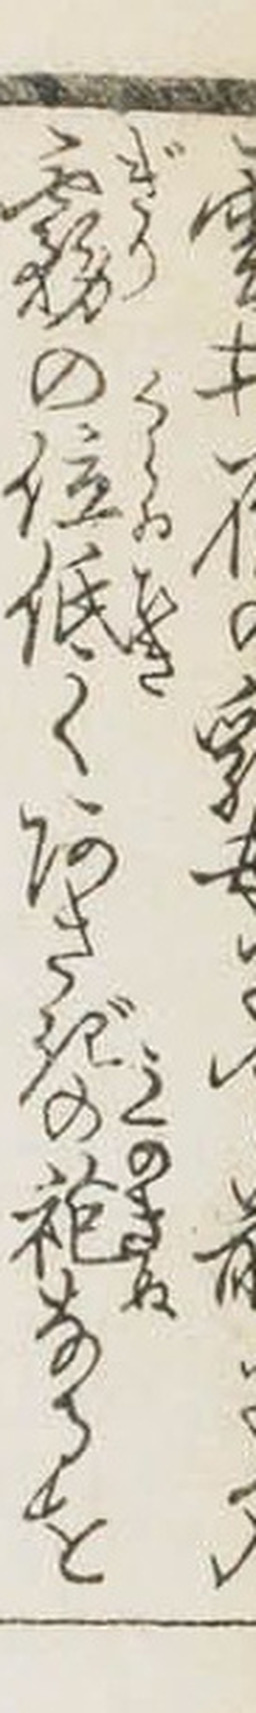霧の位低くあさぎの袍なるを
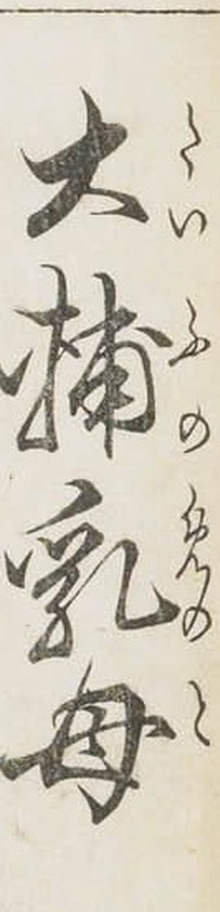大輔乳母
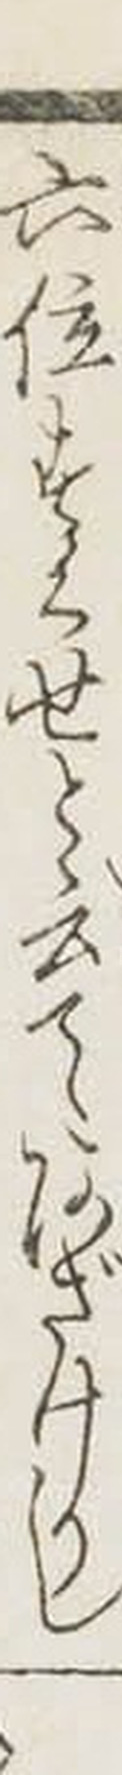六位すくせと云てあざけりし
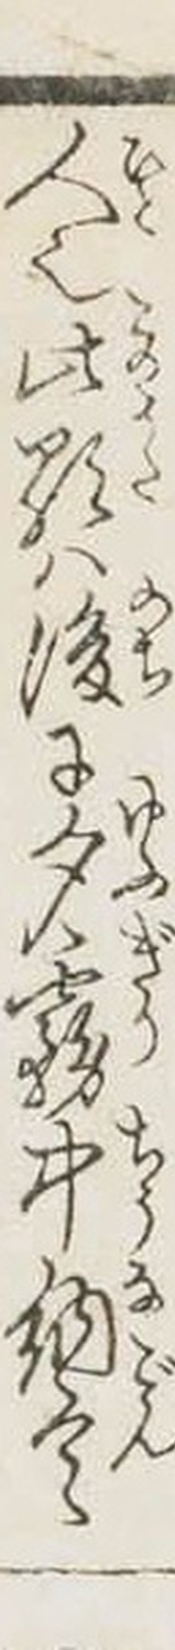人也此歌は後に夕霧中納言
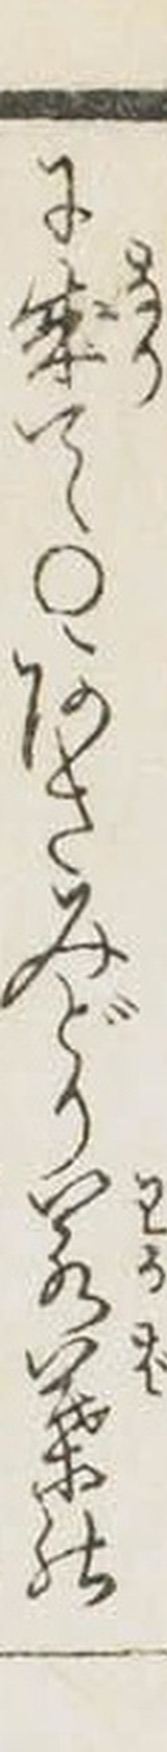に成て○あさみどり若葉の
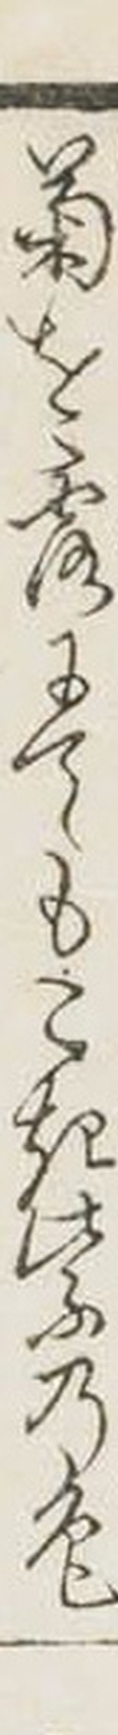菊を露にてもこき紫の色
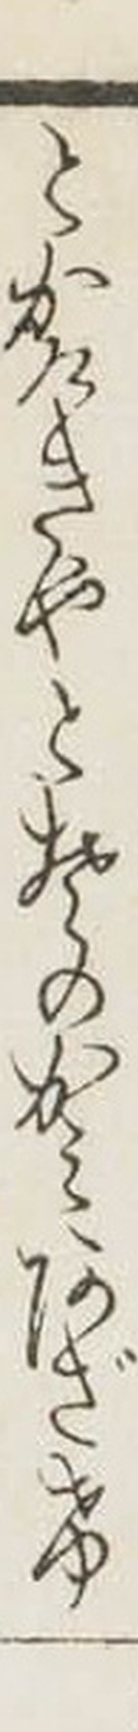とかけきやとそのかみあざけ
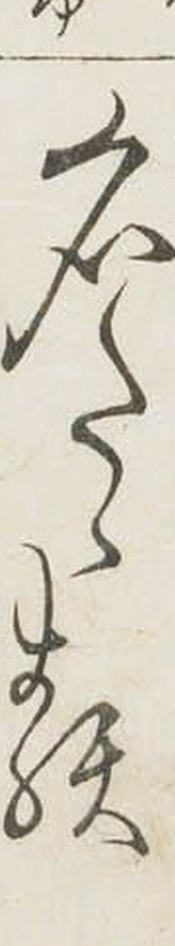名たゝる
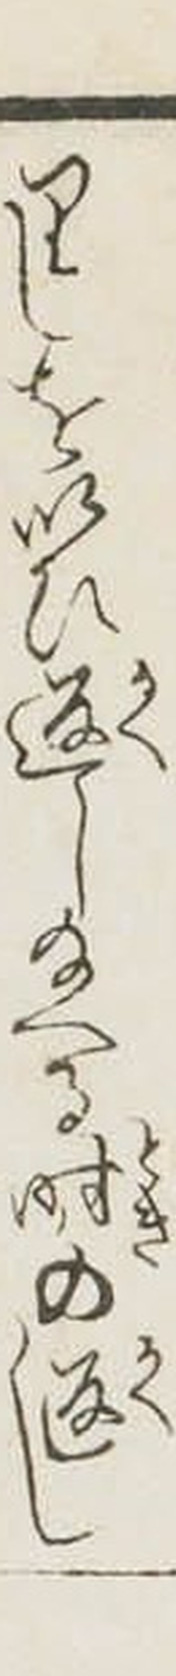りしをいひ返し給へる時の返し
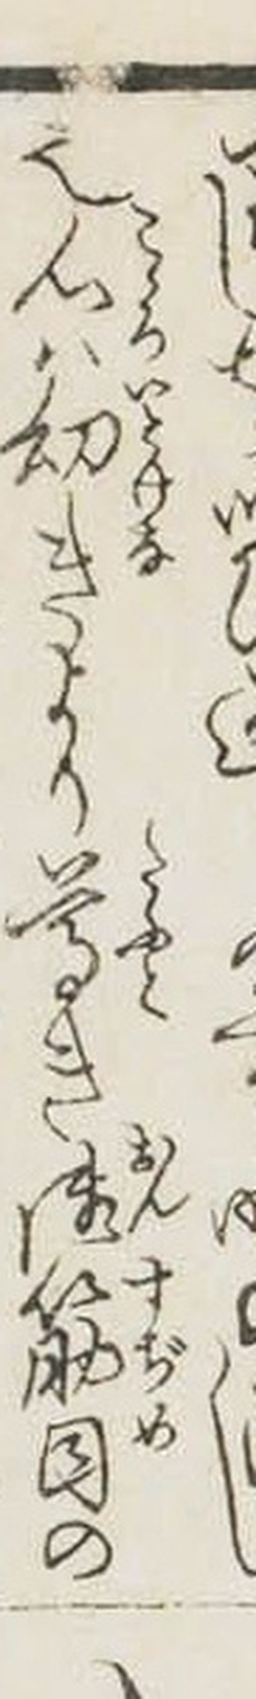也心は幼きより尊き御筋目の
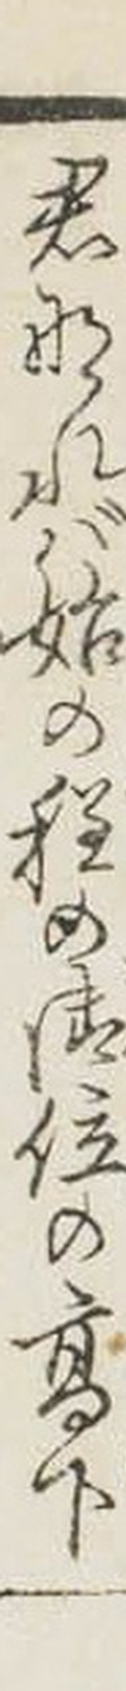君なれば始の程の御位の高下
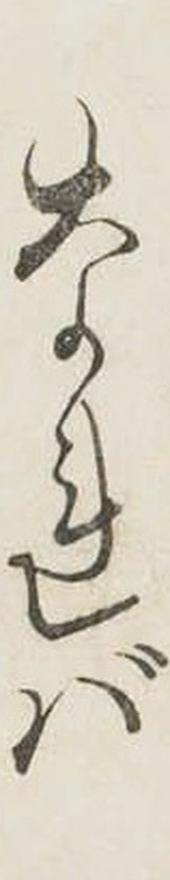なれば
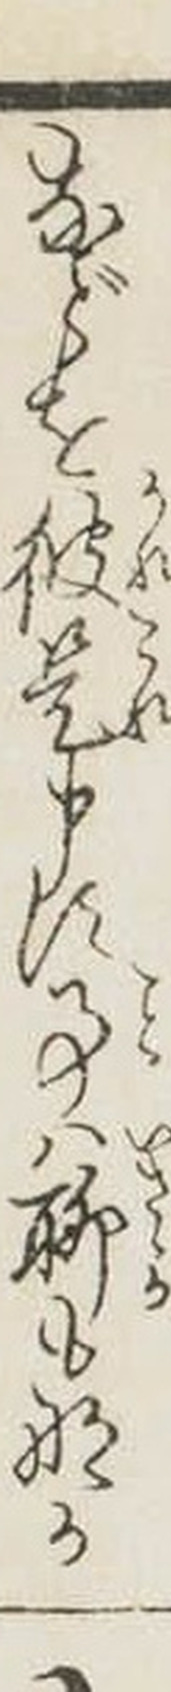などを彼是申す事は聊もなか
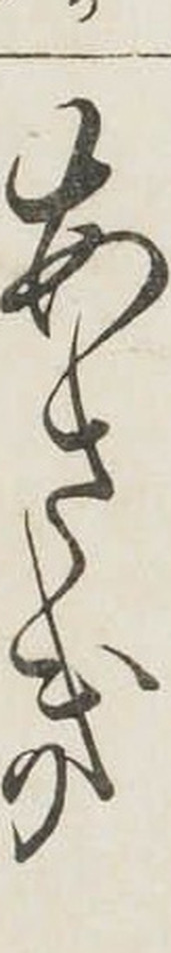あさき
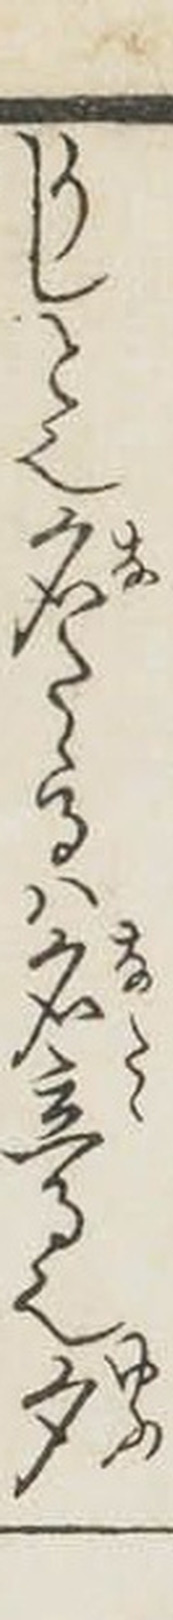りしと也名たゝるは名立る也夕
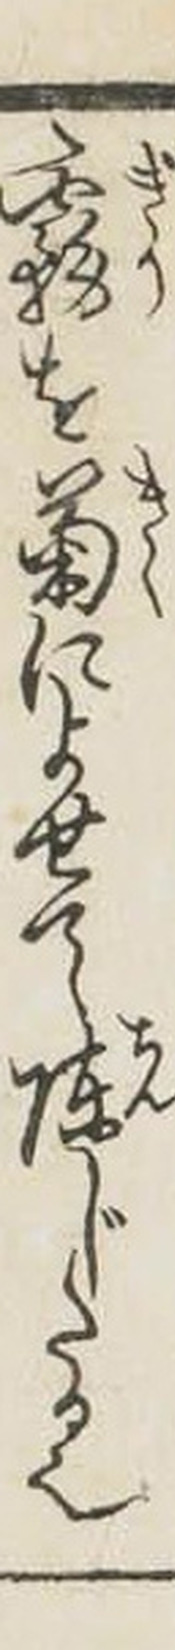霧を菊によせて陳じたる也
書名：源氏百人一首
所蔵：東京学芸大学教育コンテンツアーカイブ
